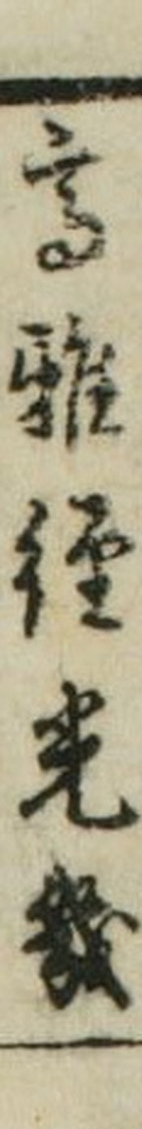高雅経光幾
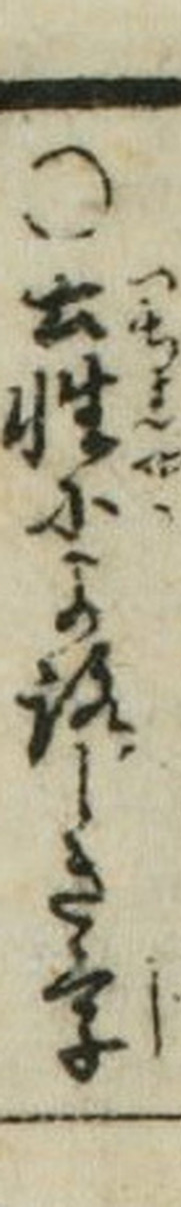○土性によろしき字
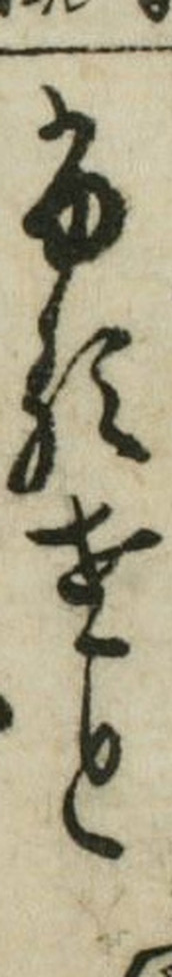ふるさと
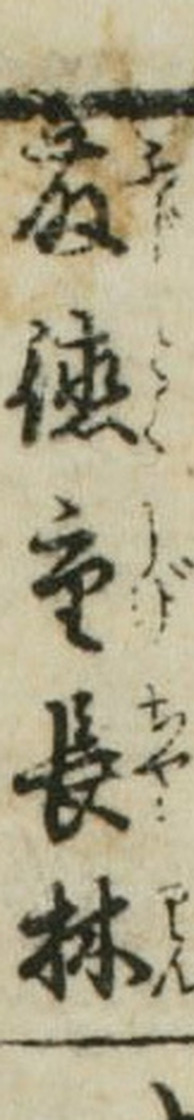藤徳重長林
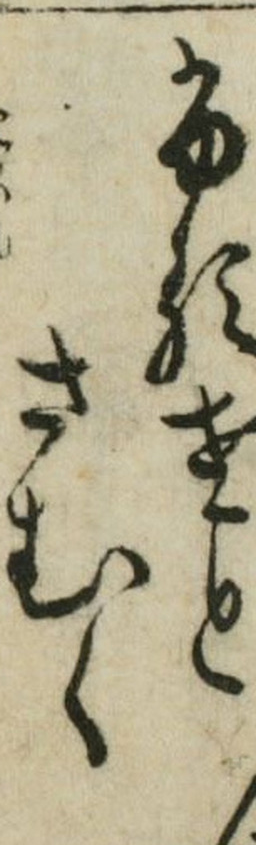さむく
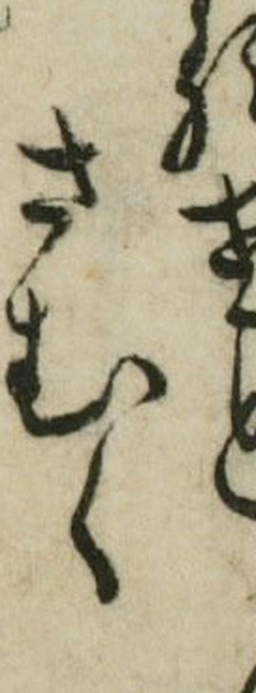さむく
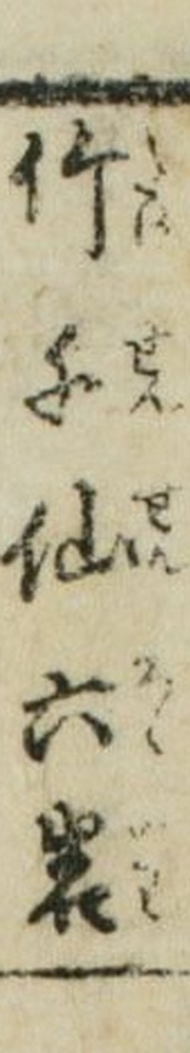竹千仙六岩
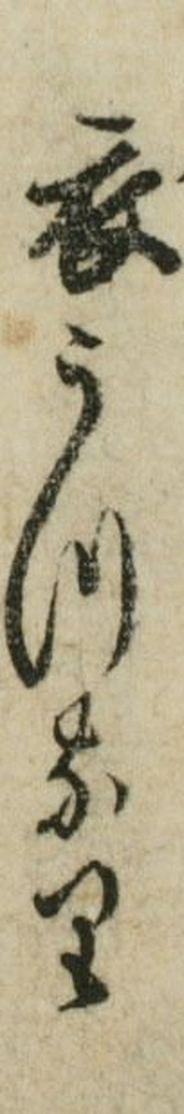衣うつなり
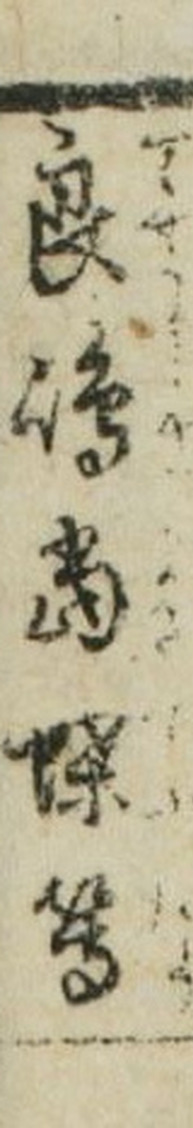良嶋當蝶等
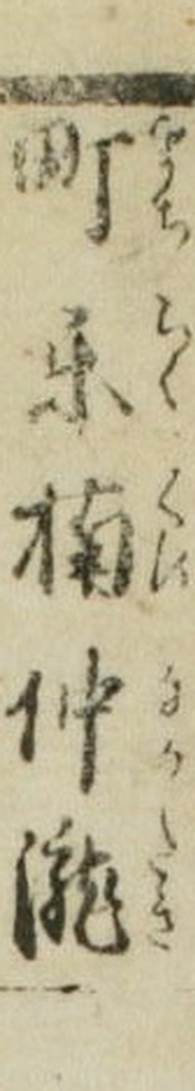町楽楠仲瀧
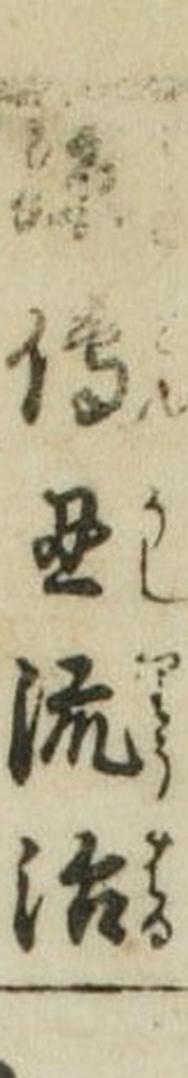孫傳丑流治
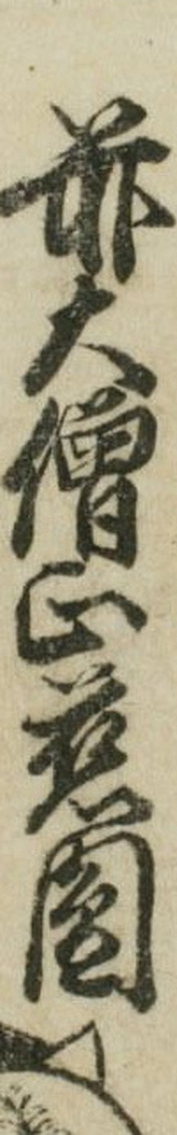前大僧正慈円
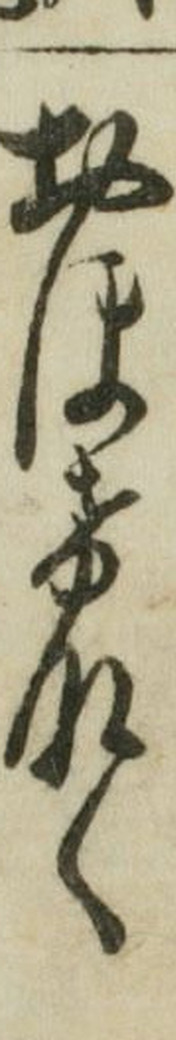おほけなく
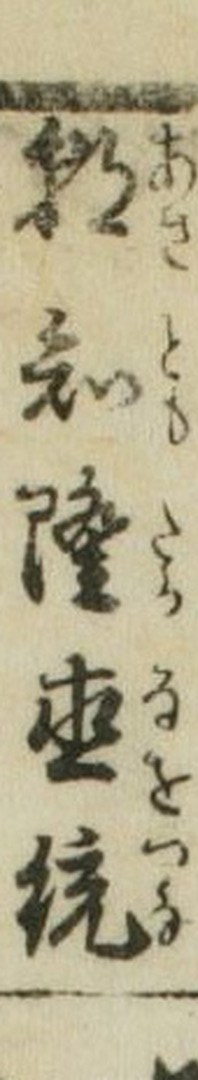朝知隆直統
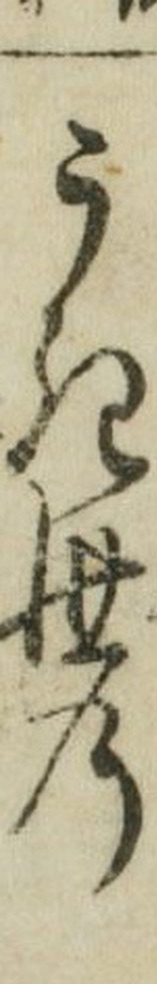うき世の
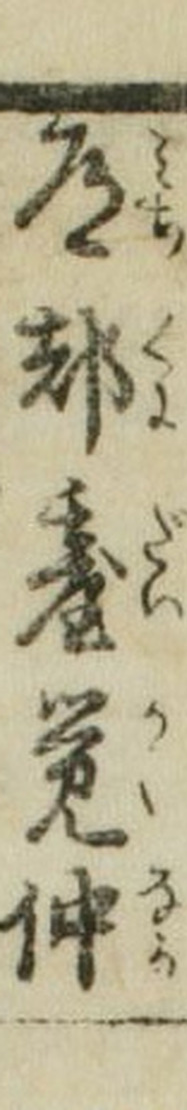道都臺覚仲
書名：百人一首
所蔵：東京学芸大学教育コンテンツアーカイブ
